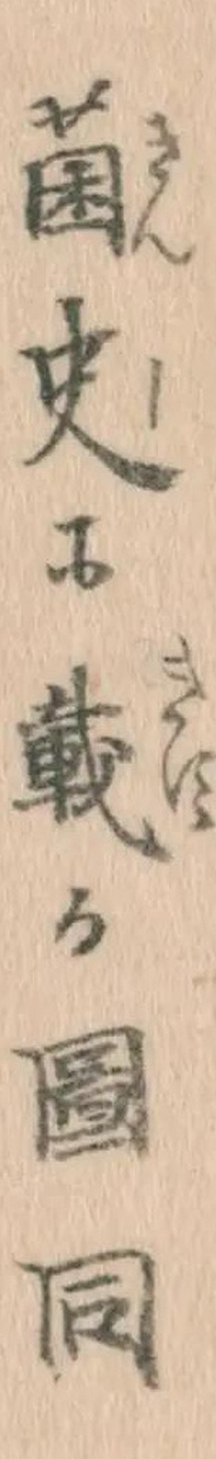菌史に載る図同
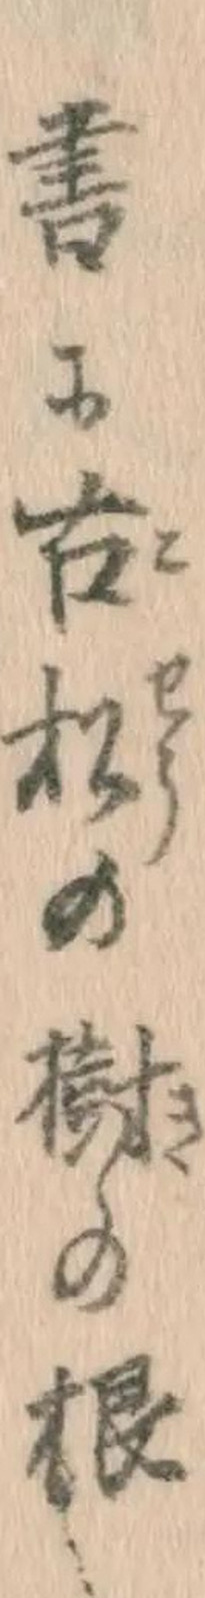書に古松の樹の根
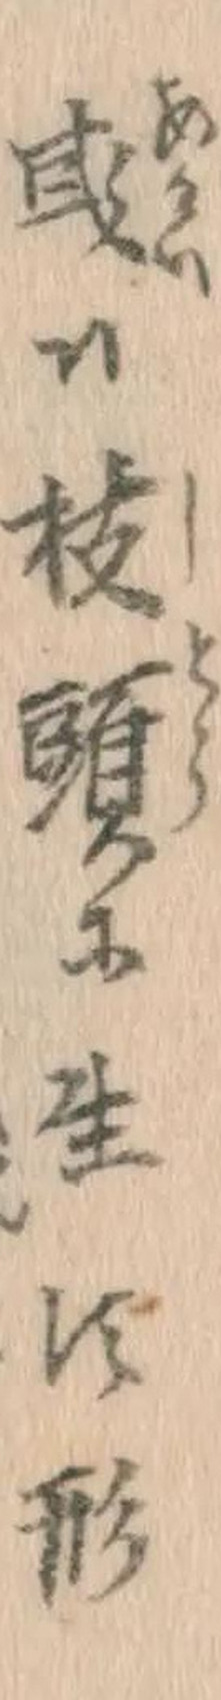或は枝頭に生す形
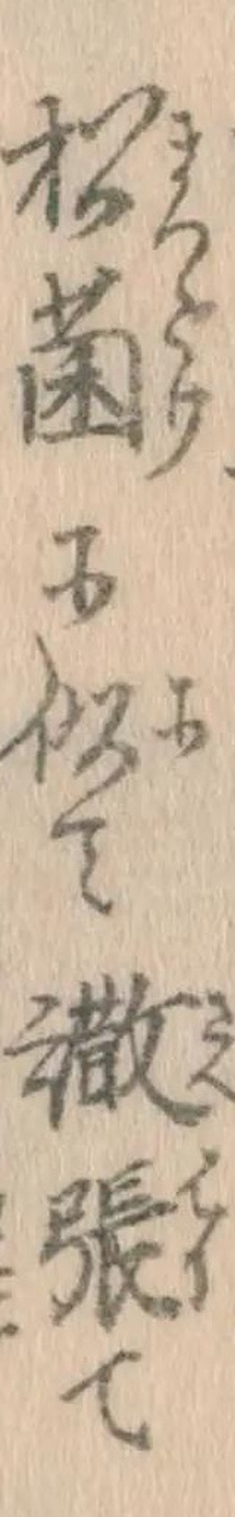松菌に似て繖張て
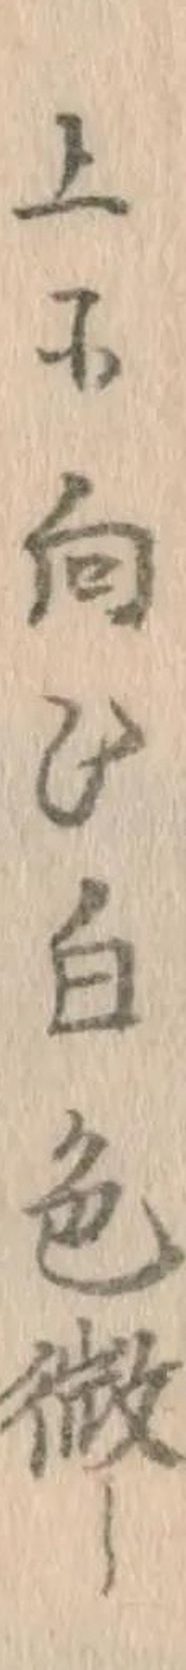上に向ひ白色微し
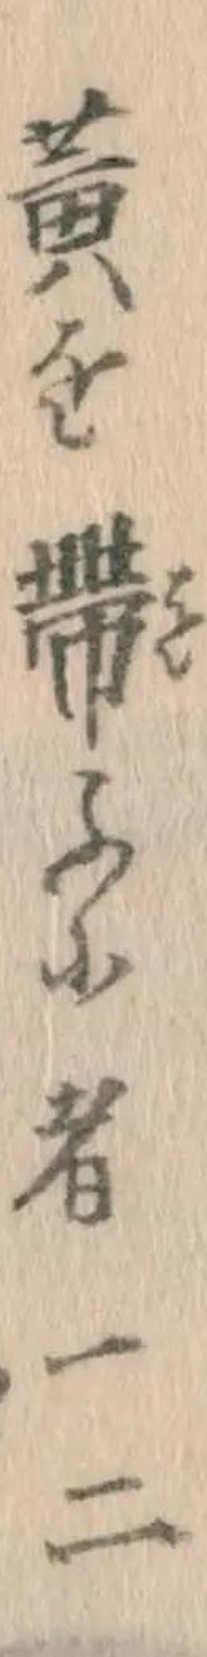黄を帯ふ小者一二
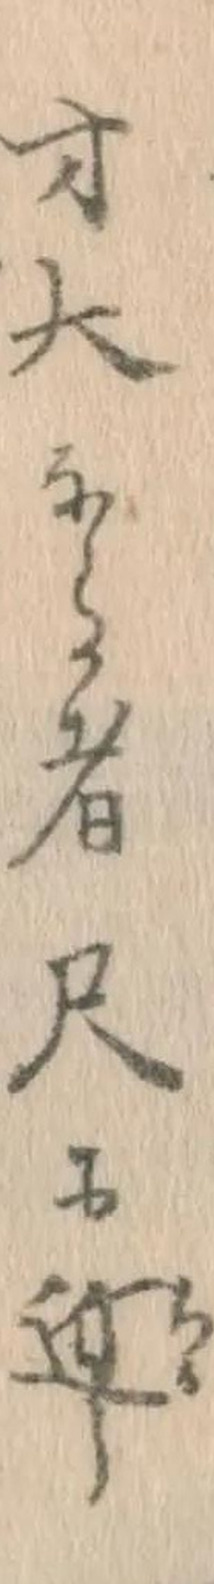寸大なる者尺に近し
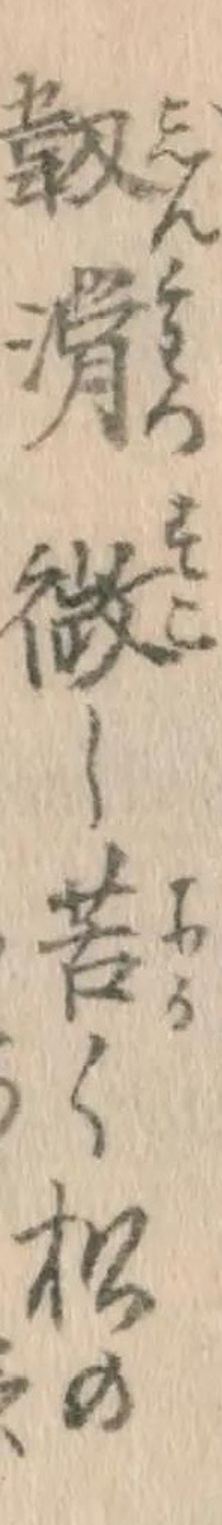靱滑微し苦く松の
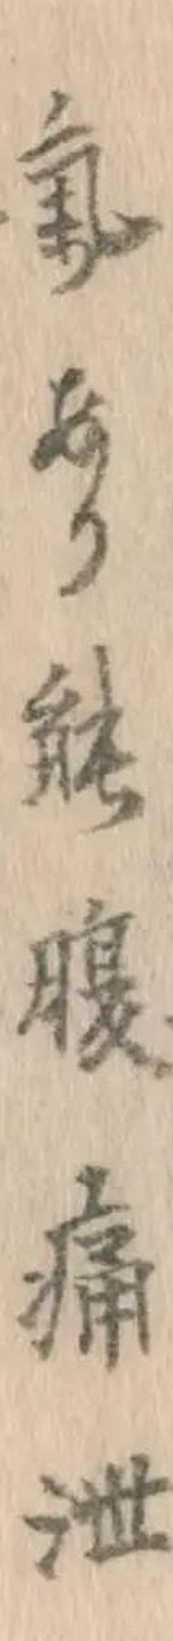気あり能腹痛泄
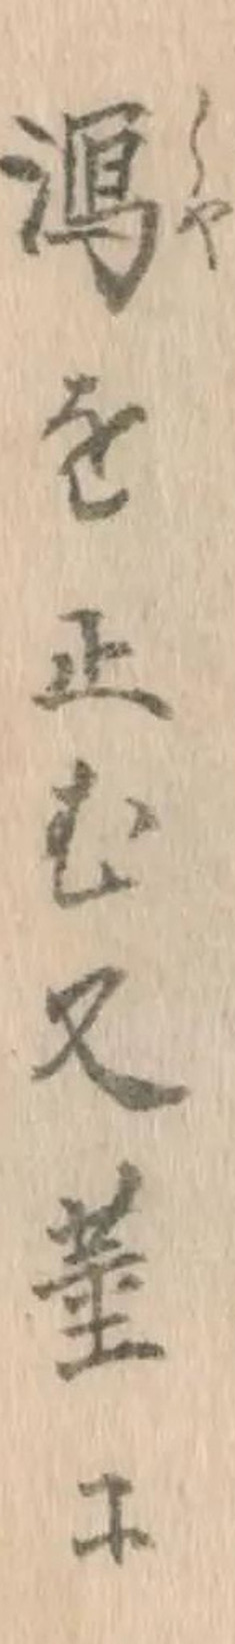瀉を止む又茎に
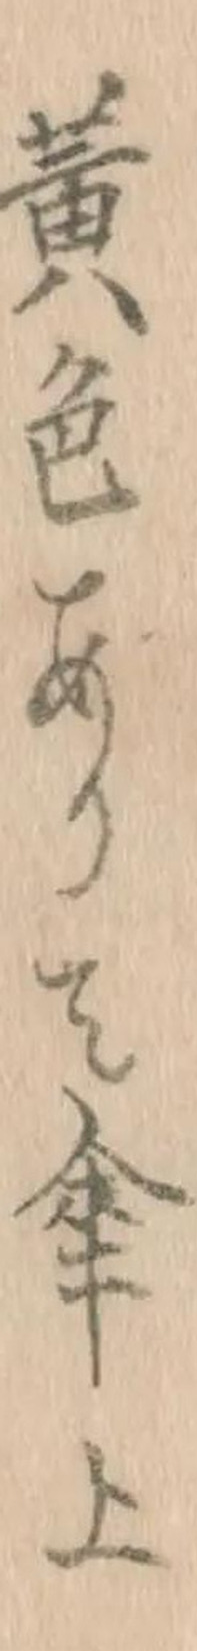黄色ありて傘上
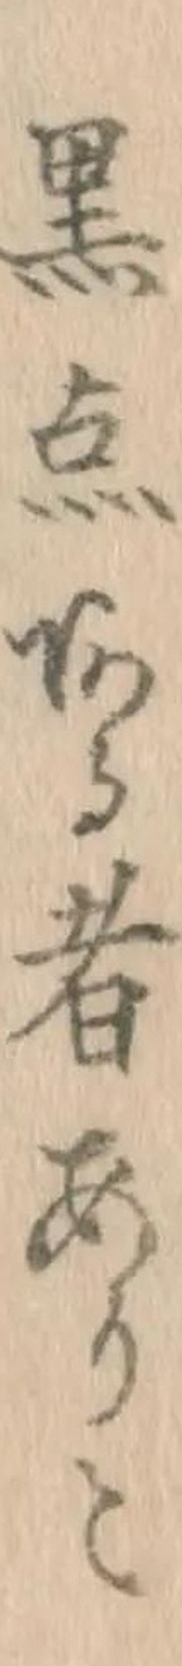黒点ある者ありと
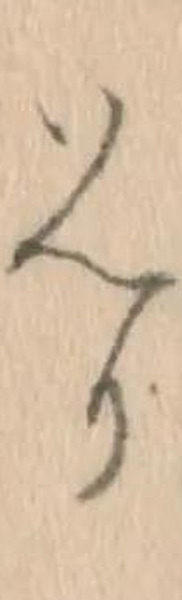いへり

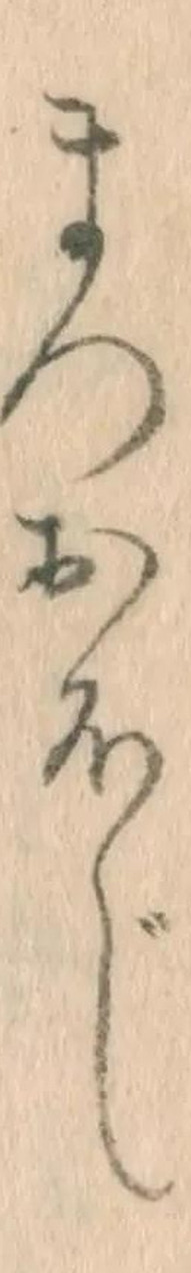まつおほじ
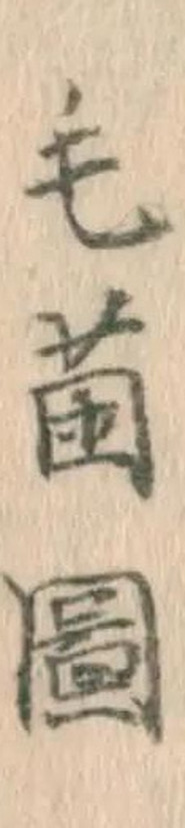毛菌図
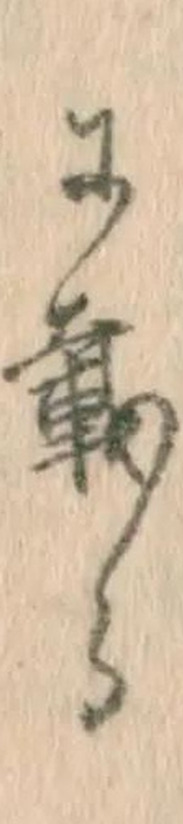に載る
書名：本草図譜. 巻55-57
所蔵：国立国会図書館 National Diet Library, JAPAN
